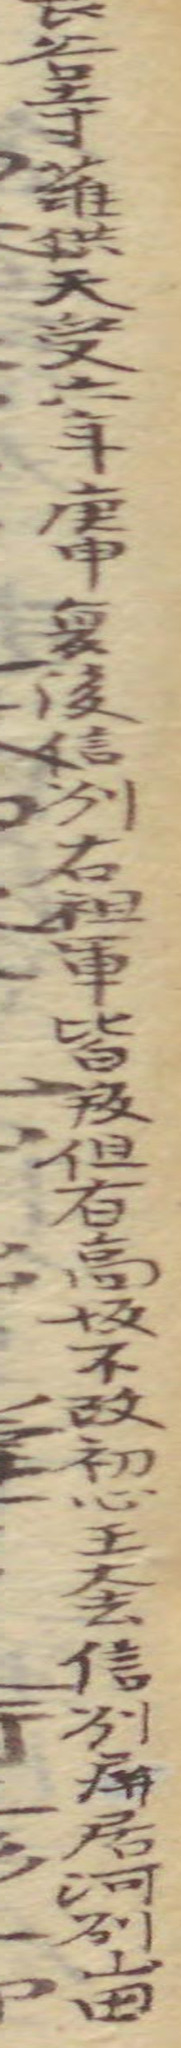於長谷寺薙供天授六年庚申夏後信州右祖軍皆叛但有高坂不改初心王大去信州屛居河州山田
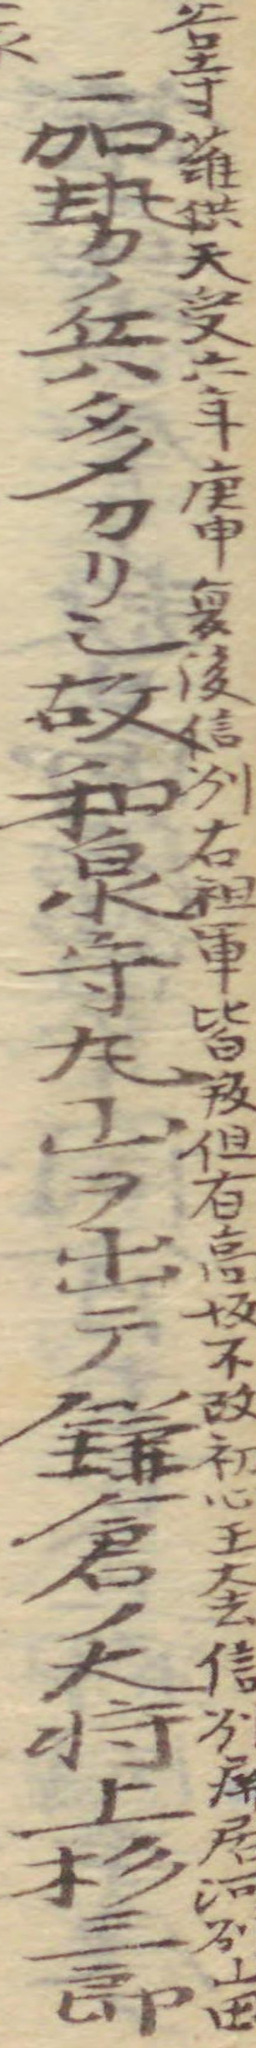二加勢ノ兵多カリシ故和泉守丸山ヲ出テ鎌倉ノ大将上杉三郎
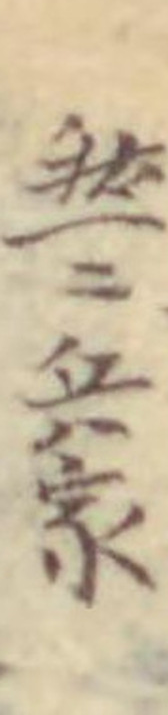然ニ兵家
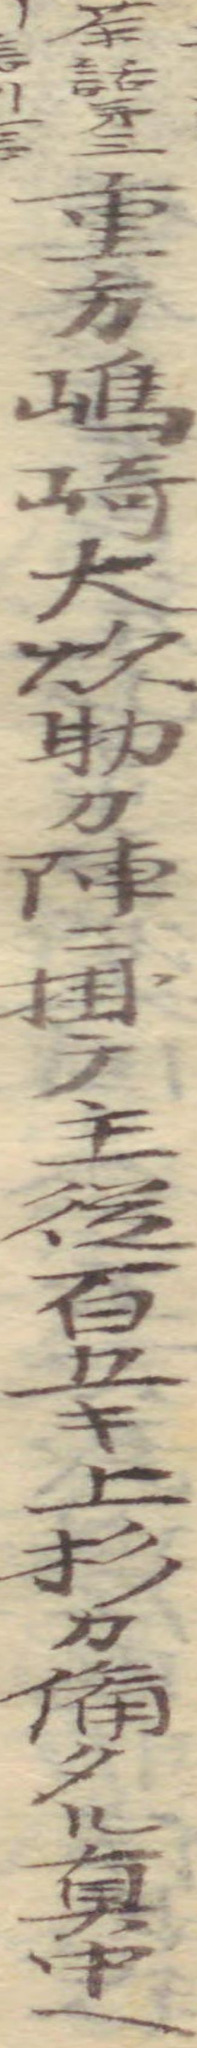重方嶋崎大炊助カ陣ニ掛テ主従百五キ上杉カ備タル真中ヘ
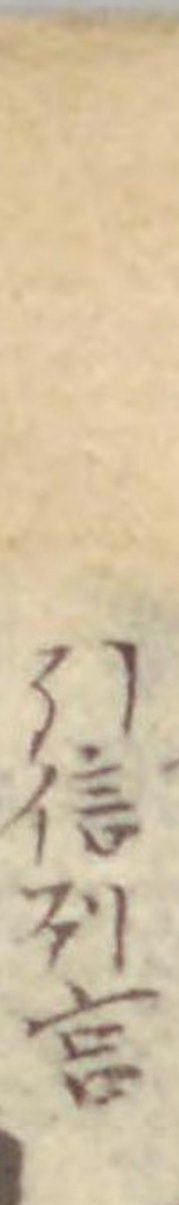引信州宮
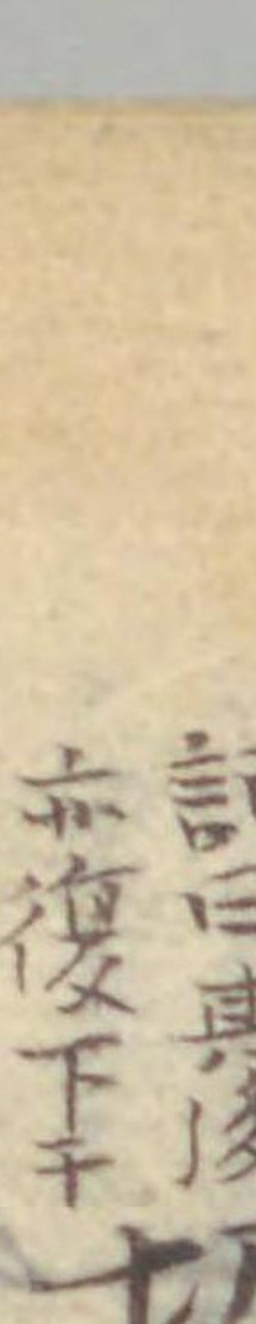亦復下于
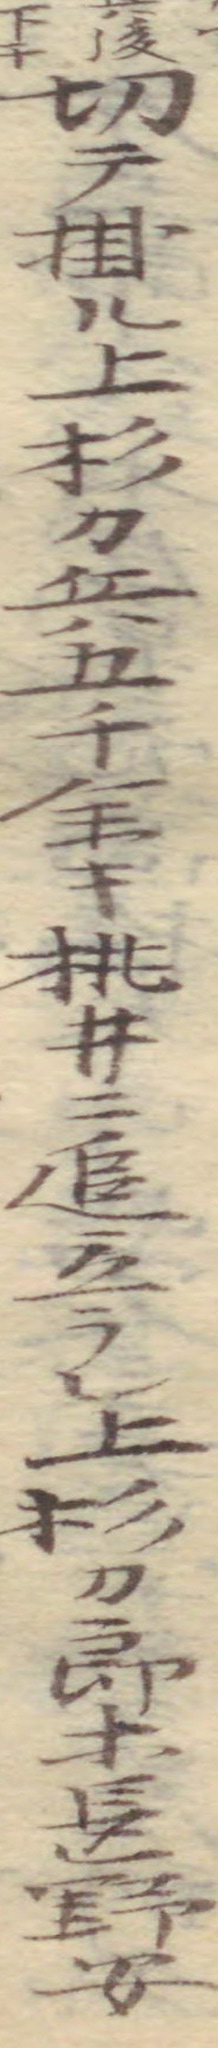切テ掛ル上杉カ兵五千余キ桃井ニ追立ラレ上杉カ郎等長野安
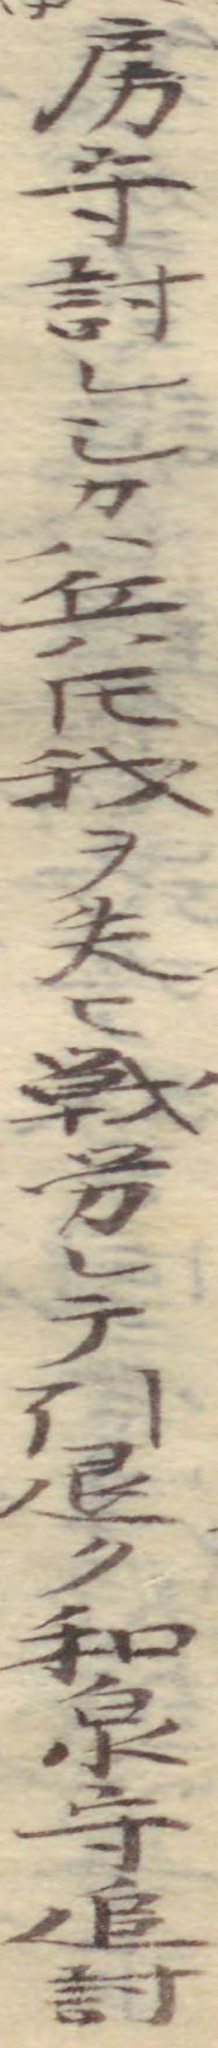房守討レシカハ兵トモ我ヲ失ヒ戦労シテ引退ク和泉守追討
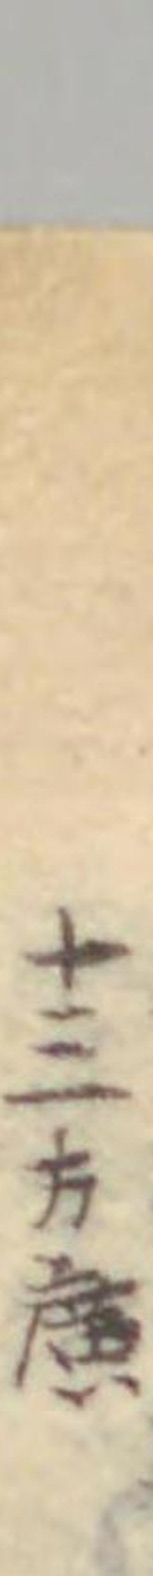十三方広
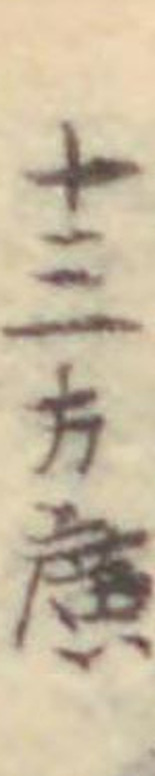十三方広
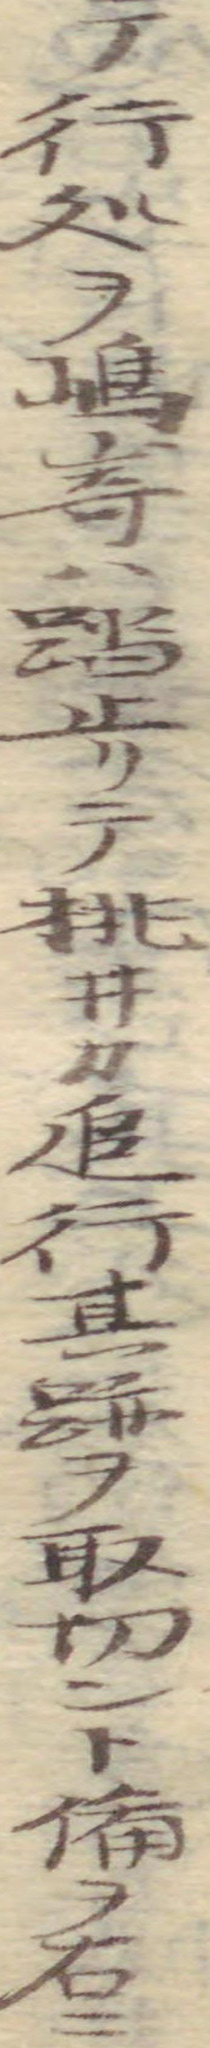テ行処ヲ嶋崎ハ踏止リテ桃井カ追行其跡ヲ取切ント備ヲ右ニ
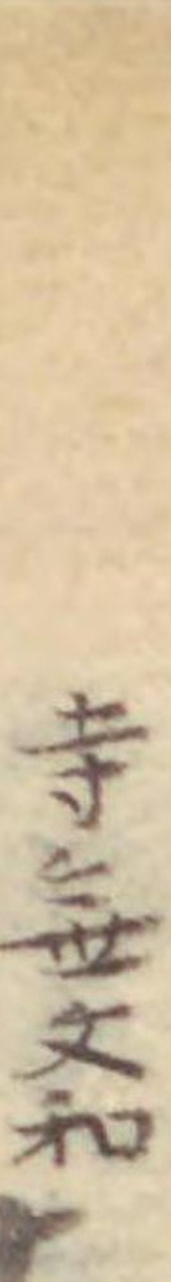寺無文和
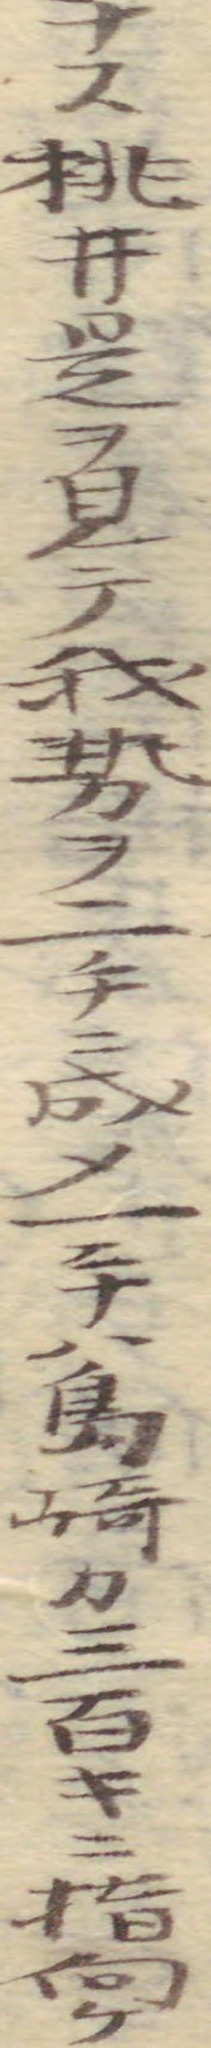ナス桃井是ヲ見テ我勢ヲ二手ニ成シテ一手ハ島崎カ三百キニ指向ケ
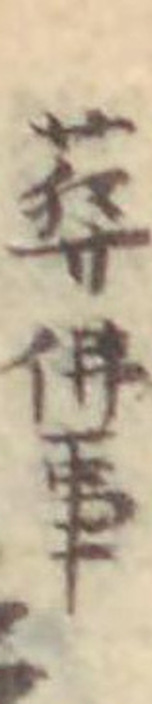葬佛事
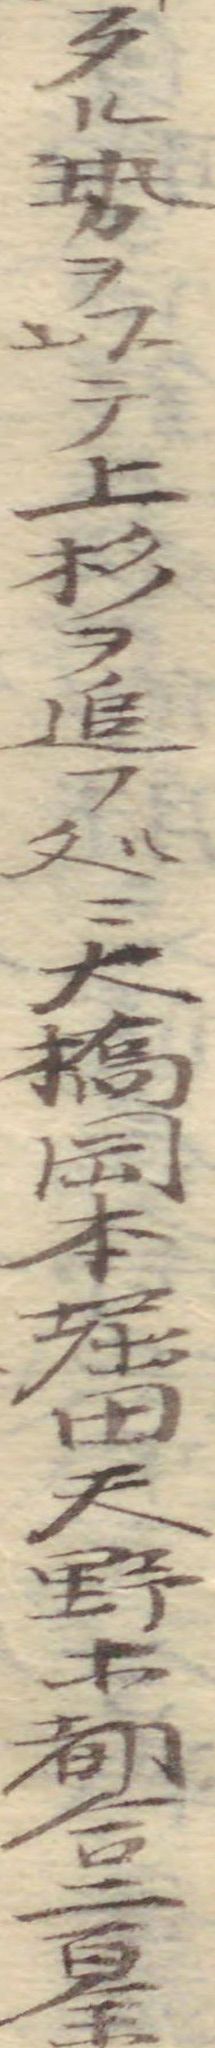タル勢ヲ以テ上杉ヲ追フ処ニ大橋岡本堀田天野等都合三百余
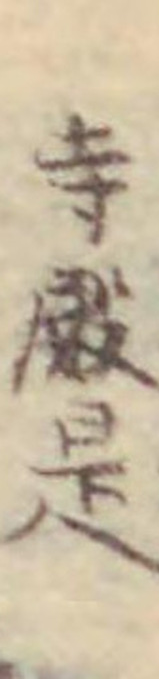寺殿是
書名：鶯宿雑記. 巻199-200
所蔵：国立国会図書館 National Diet Library, JAPAN
